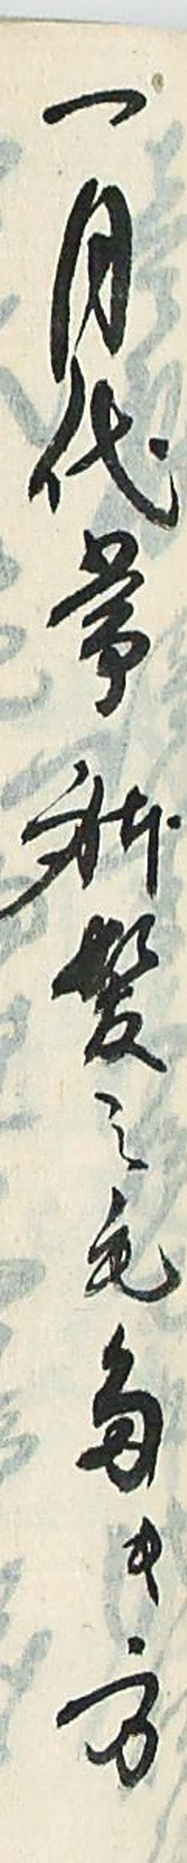一月代常体髪之毛多き方
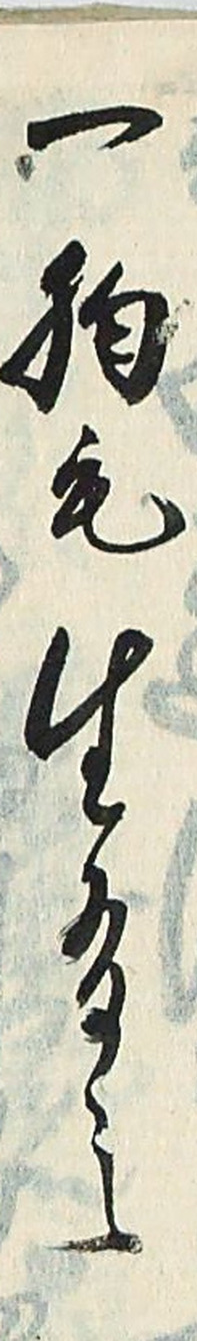一胸毛生有之
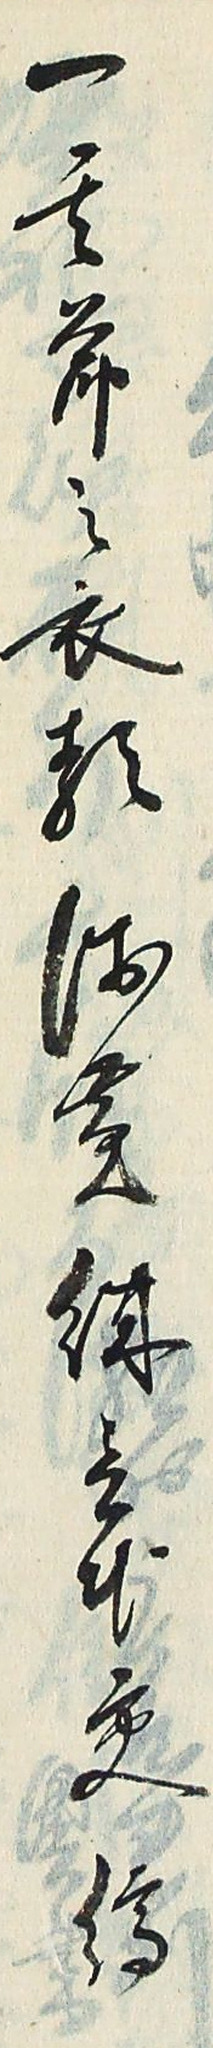一其節之衣類浅黄紺壱本交縞
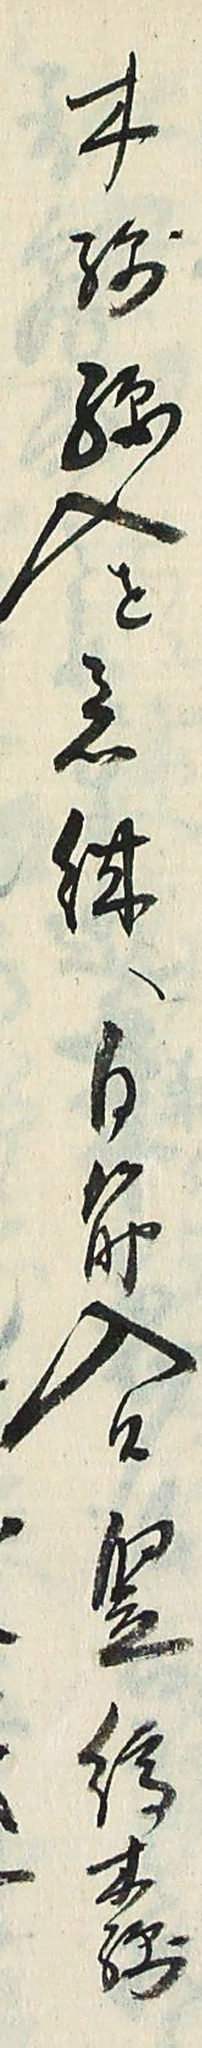木綿綿入を着紺へ白筋入候竪縞木綿
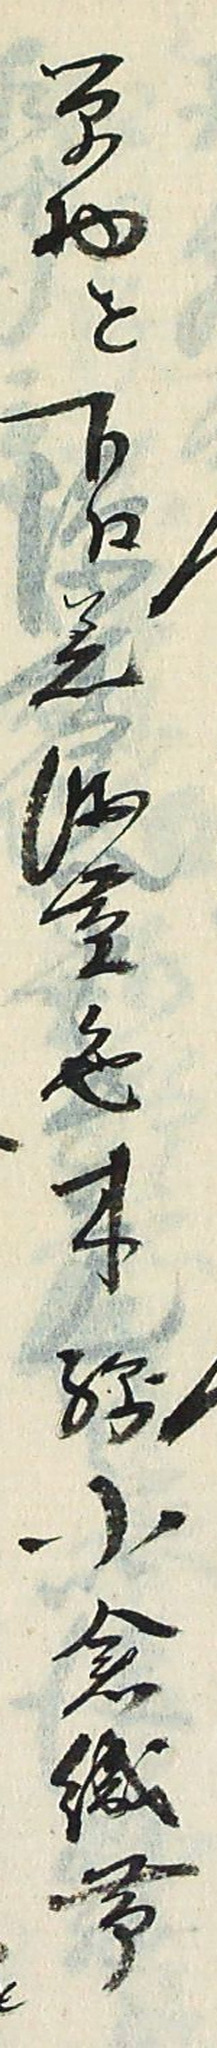単物を下江着浅黄色木綿小倉織帯
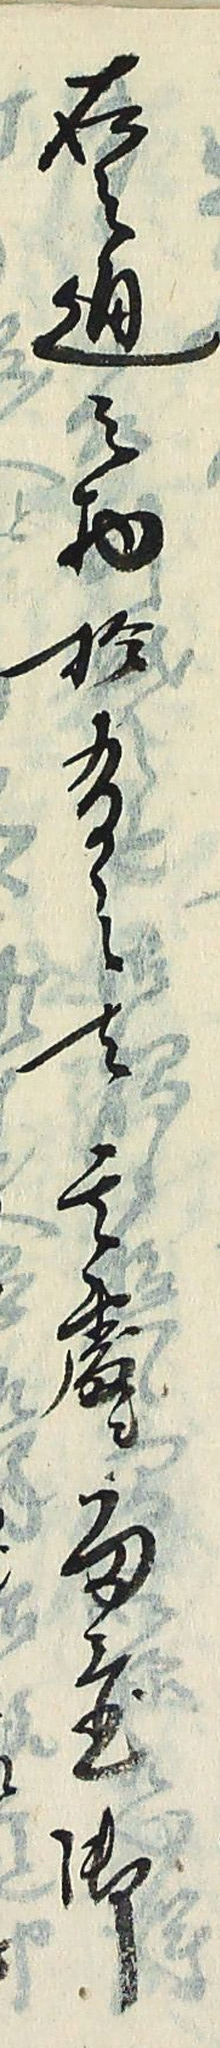右之通之物於有之は其処に留置御
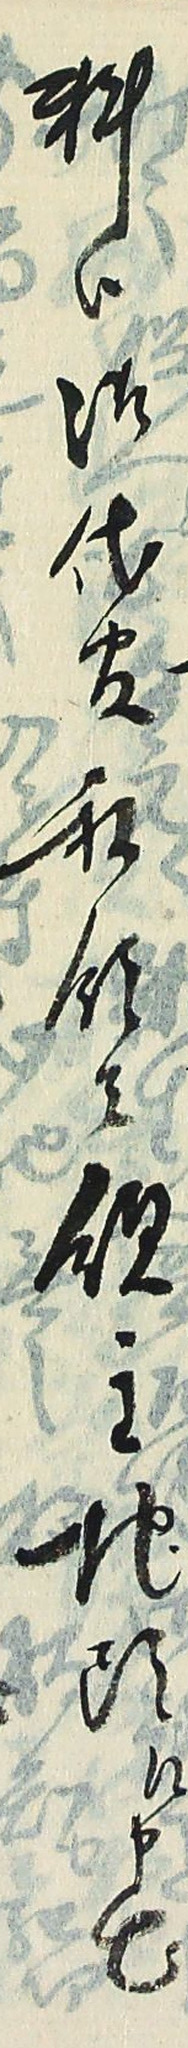料は御代官私領は領主地頭江申出
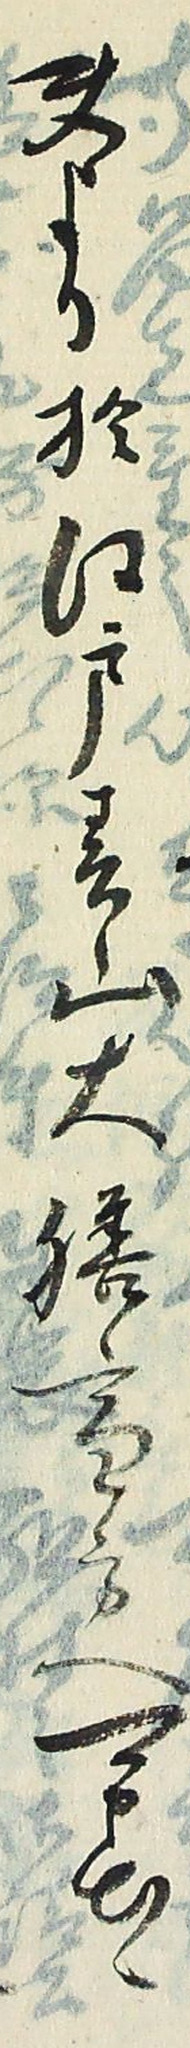夫より於江戸青山大膳亮方へ可申出候
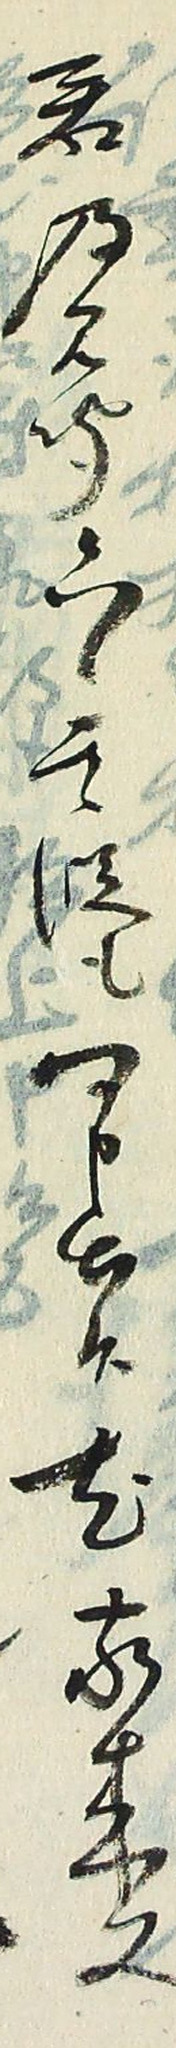若及見聞候はゝ其段も可申出候尤家来又
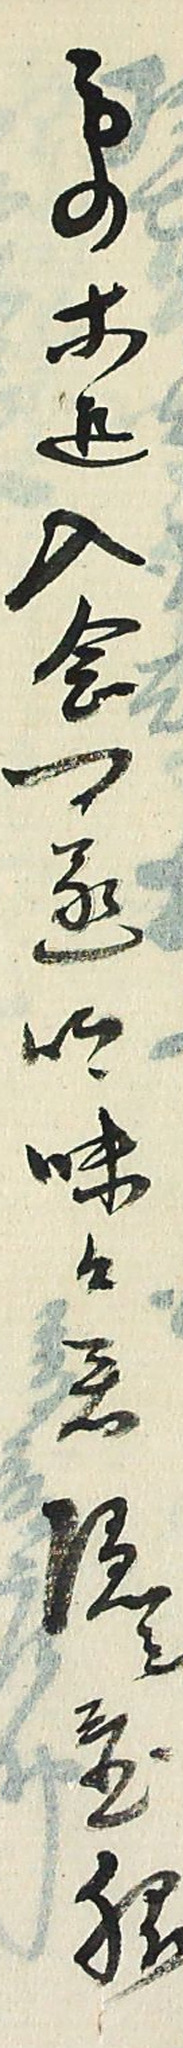もの等迄入念可遂吟味候若隠し置脇
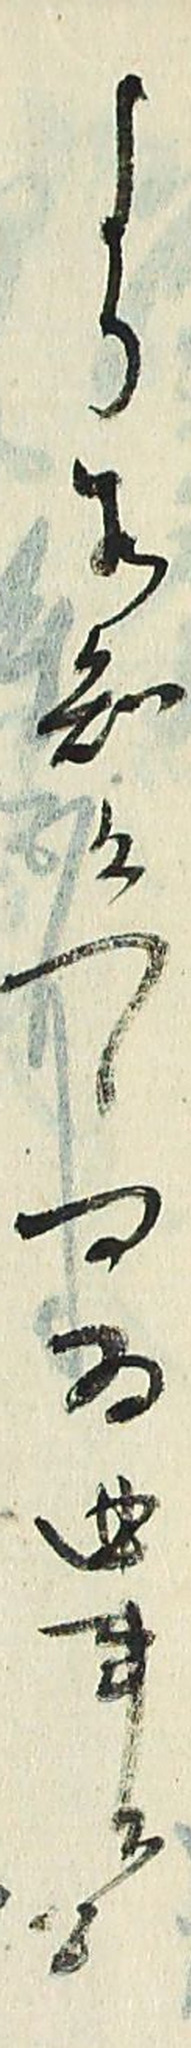ゟ相知候はゝ可為曲事候以上
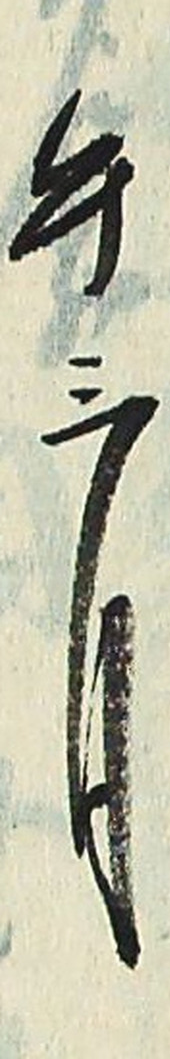午三月
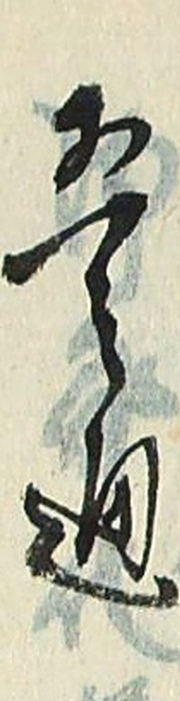右之通
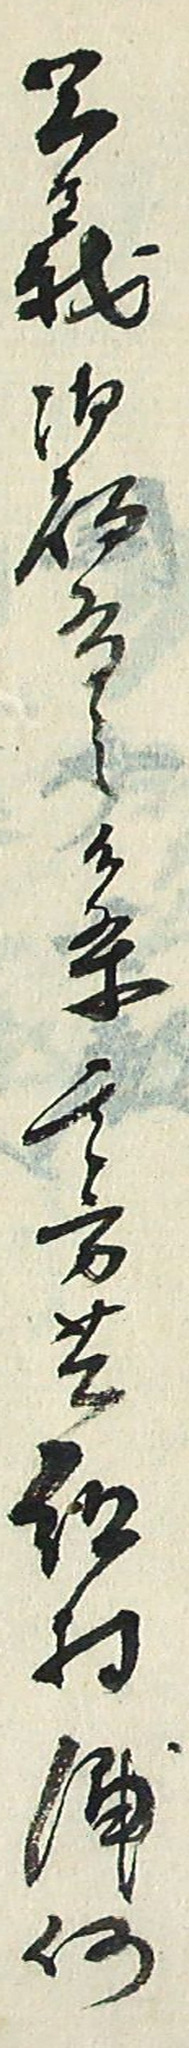公義御触有之候条其方共組村浦何
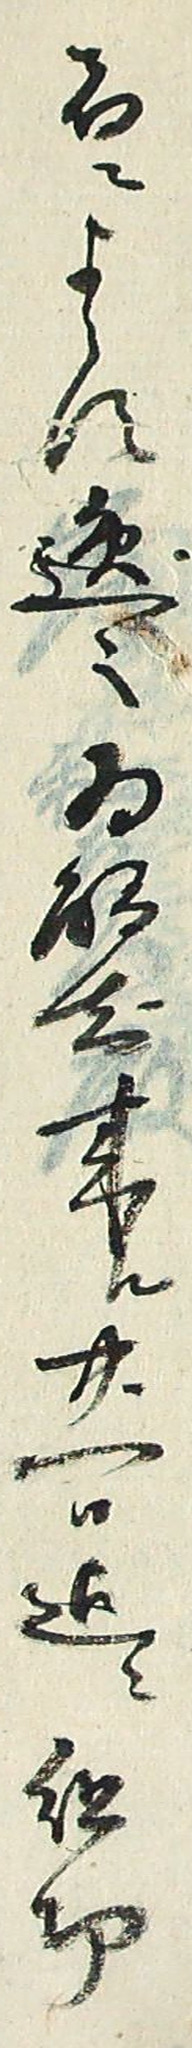者によらす逸々為触知来る廿一日迄に組切

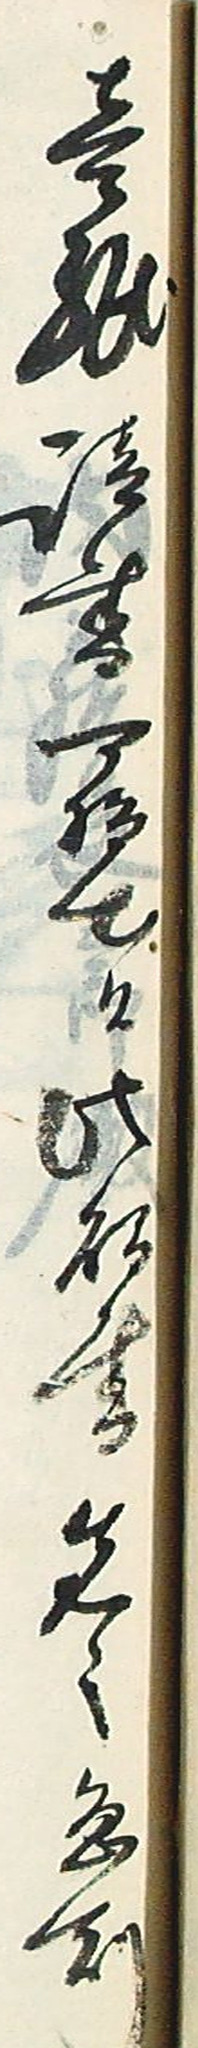壱紙請書可指出候此触書先々急刻
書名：諸御用御□受書控
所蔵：鳴門教育大学 Naruto University of Education
